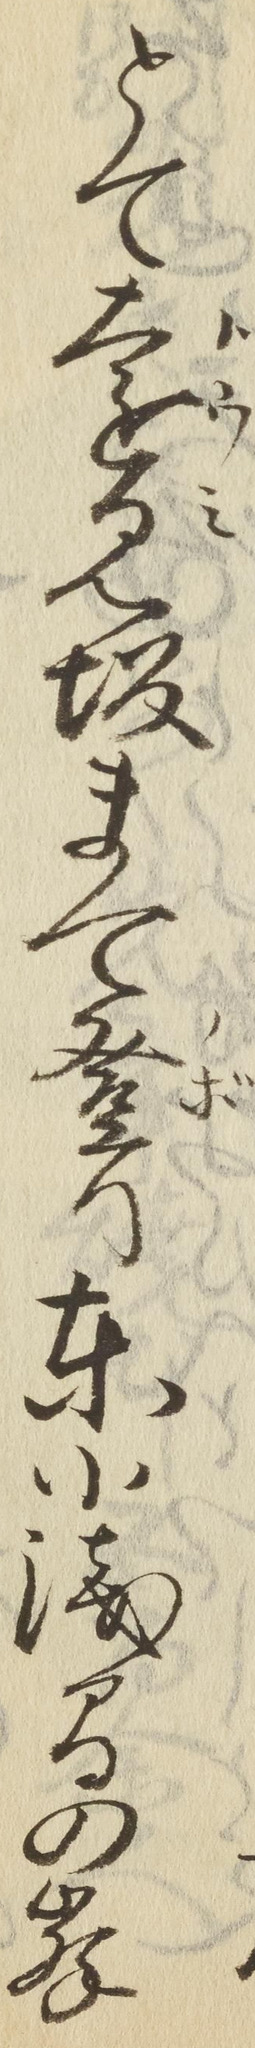とて遠見坂まで登り東小浅間の峯
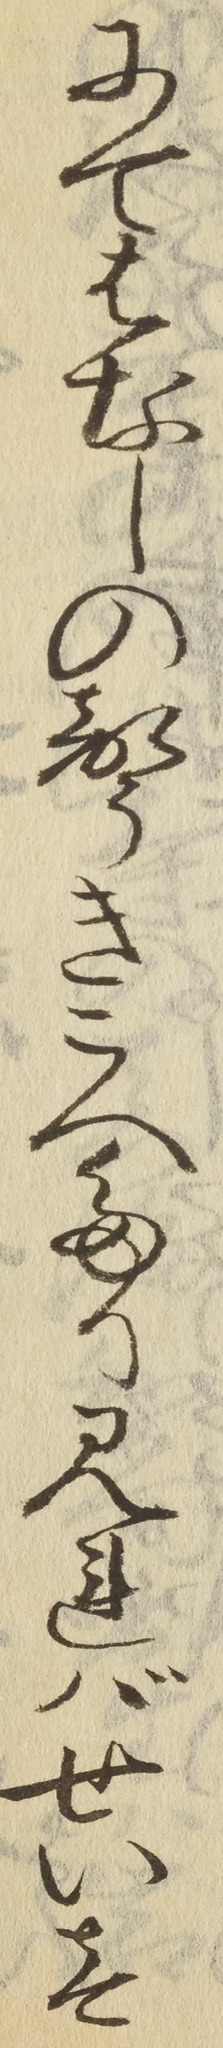にてはなしの声きこへたり見ればせい壱
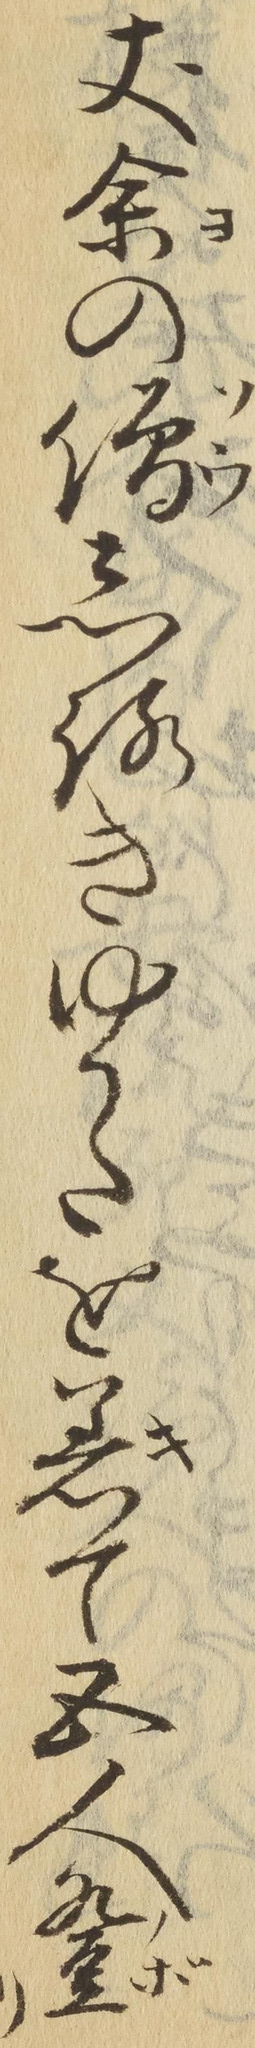丈余の僧しろきゆかたを着て五人登り

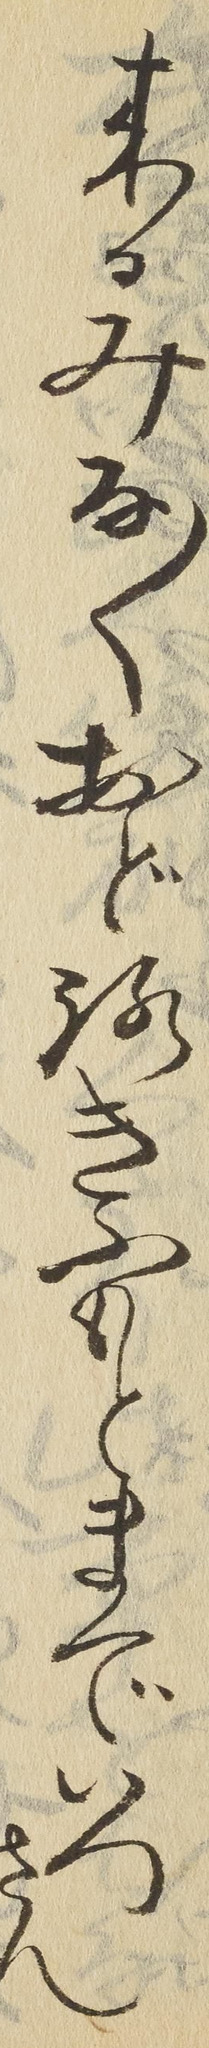来るみな〳〵おどろきふもとまでいつさん
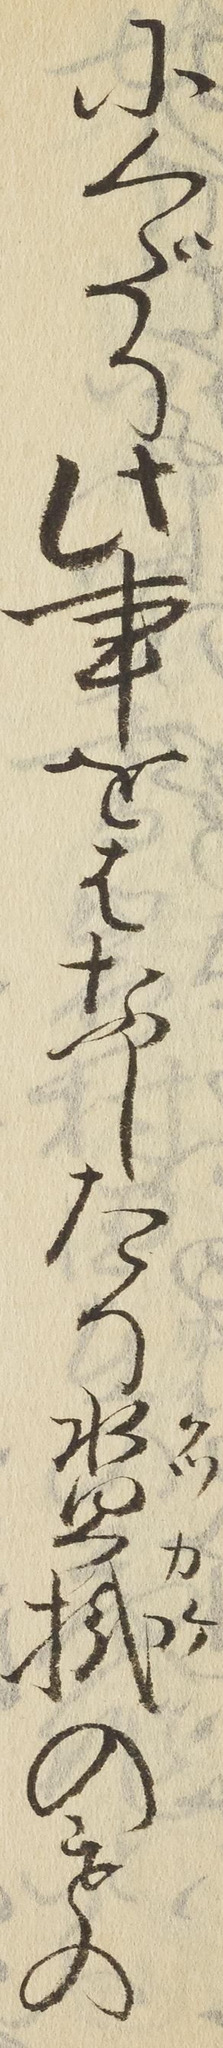にくだり此事をはなしたり沓掛のもの
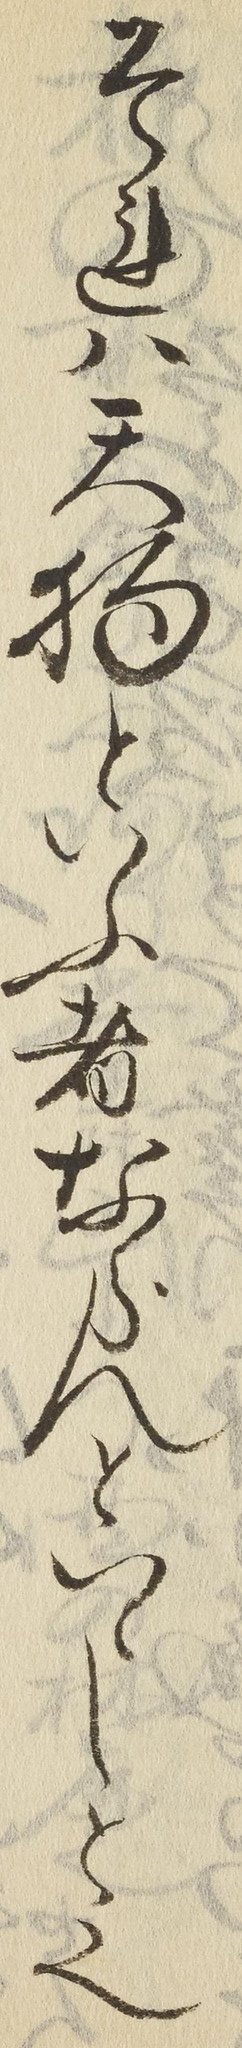それは天狗といふ者ならんといゝしと也
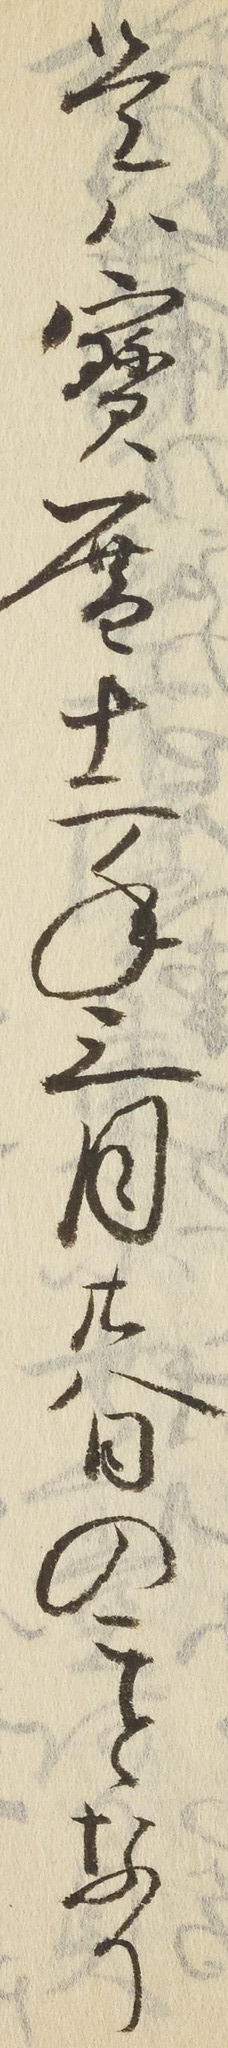是は宝暦十二年三月廿八日のことなり
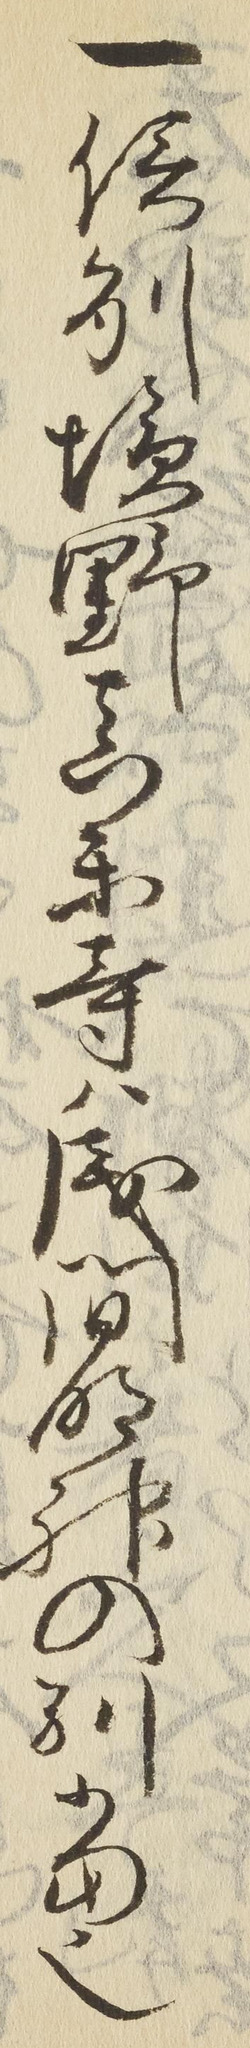一信州塩野真楽寺は浅間明神の別当也
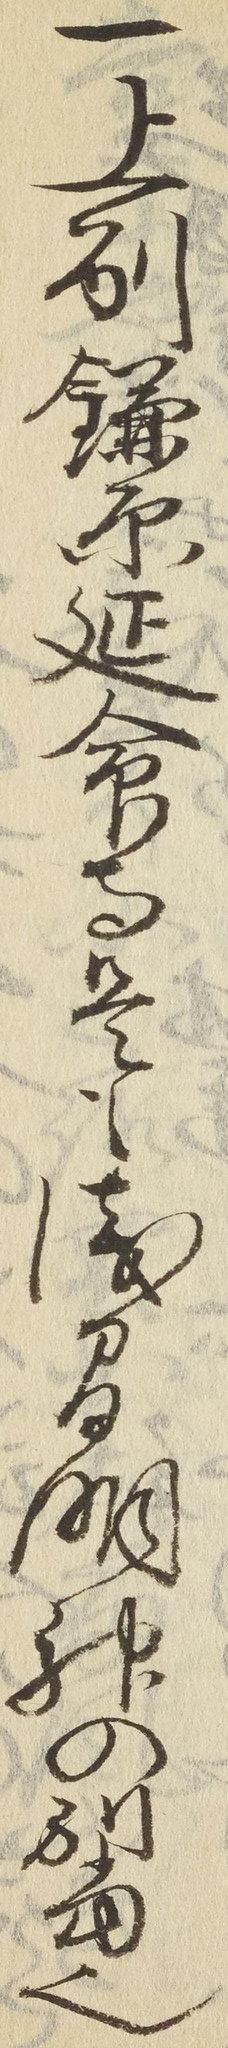一上州鎌原延命寺是も浅間明神の別当也
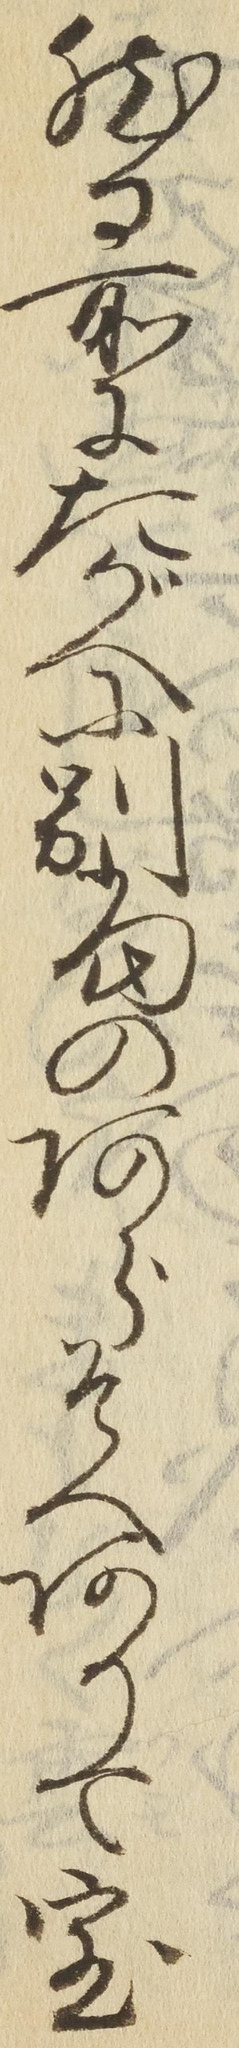然る所にたがへに別当のあらそへありて宝
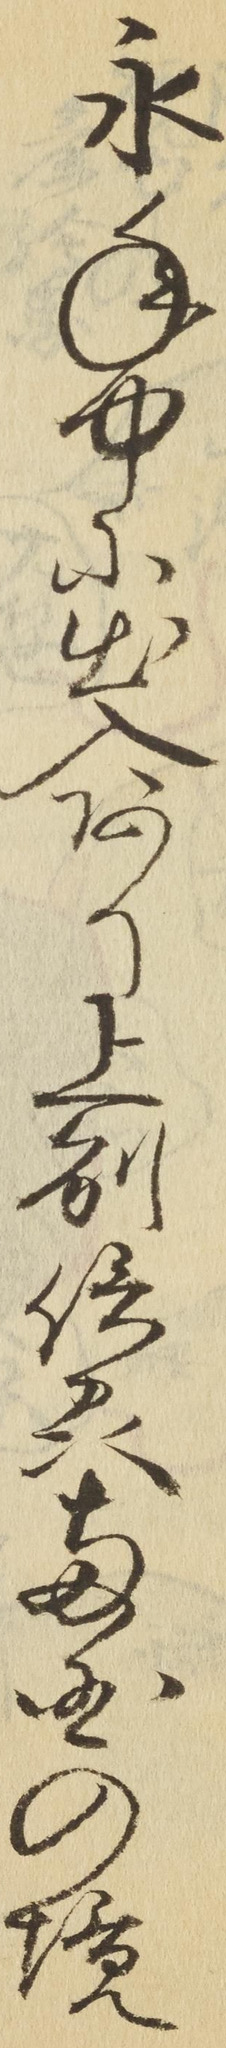永年中に出入あり上州信州両国の境
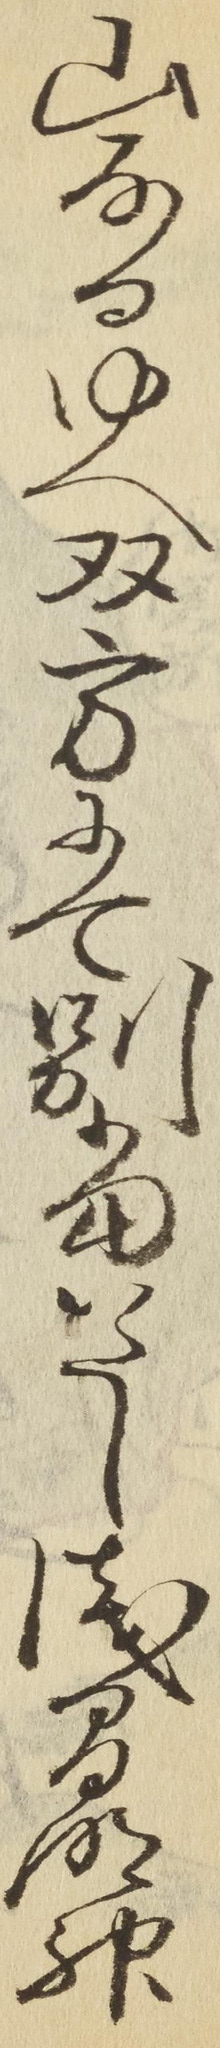山なるゆへ双方にて別当いたし浅間明神
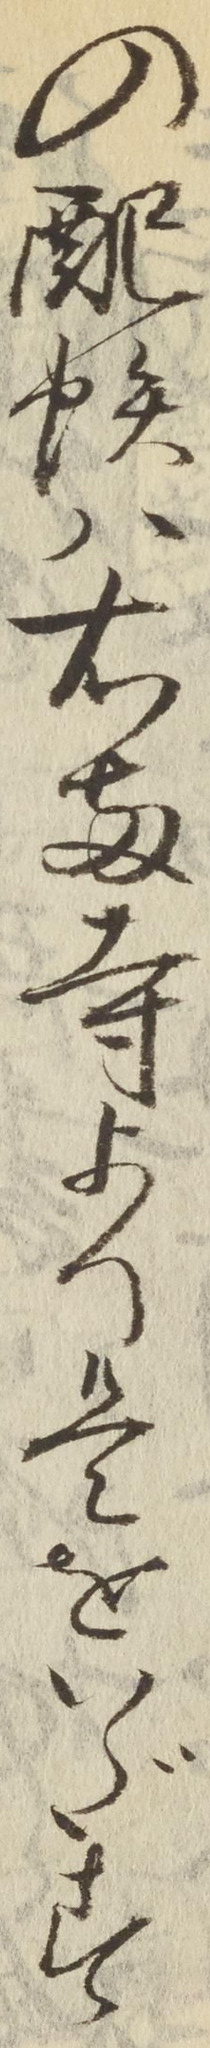の配帙は右両寺より是をいだす
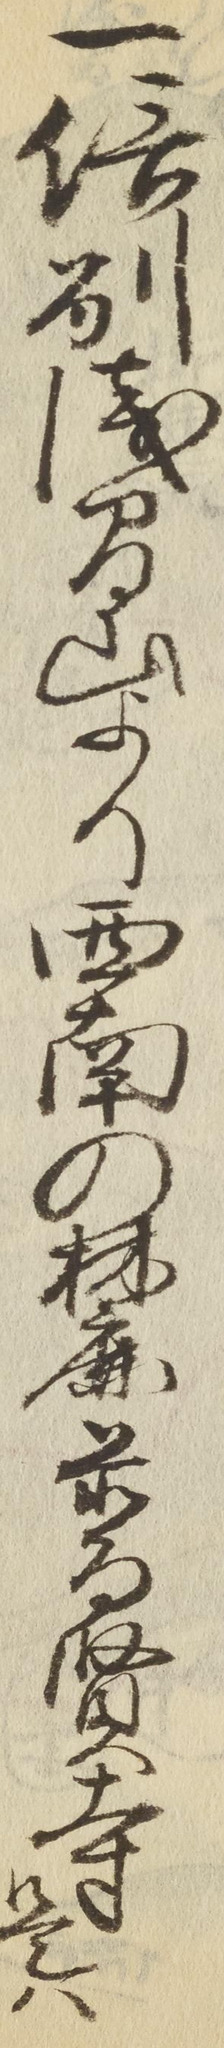一信州浅間山より西南の麓普賢寺是は
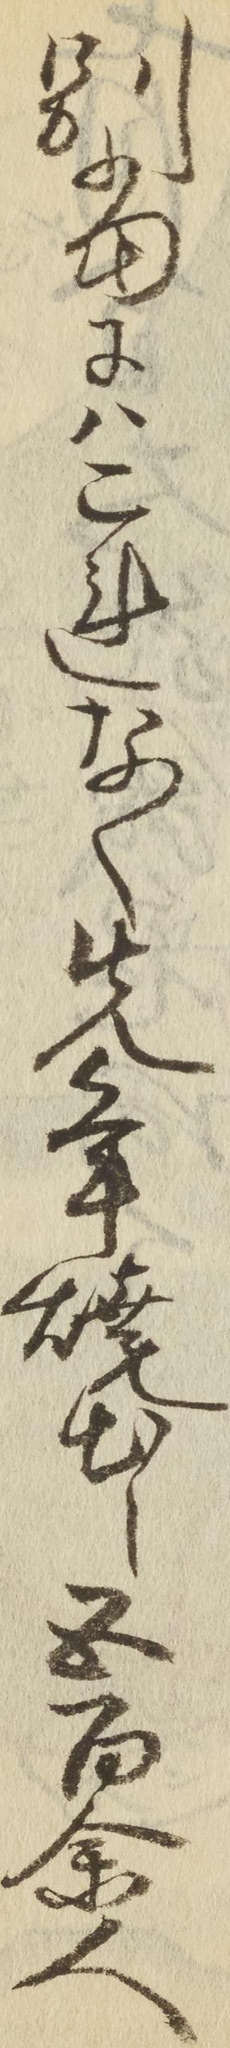別当にはこれなく先年焼出し五百余人
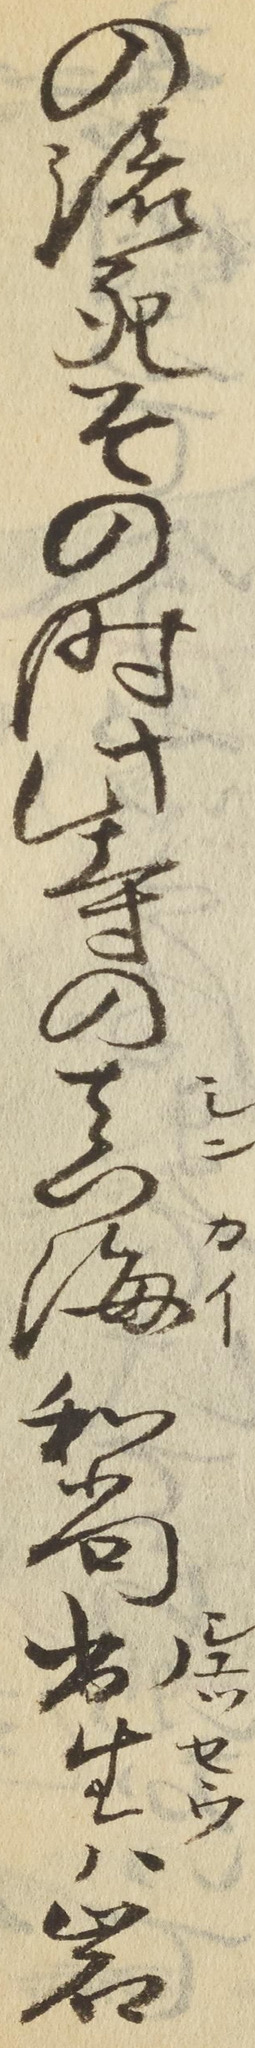の流死その時此寺の真海和尚出生は岩
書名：浅間大變記
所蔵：東京大学地震研究所図書室 Earthquake Research Institute Library, The University of Tokyo, JAPAN
